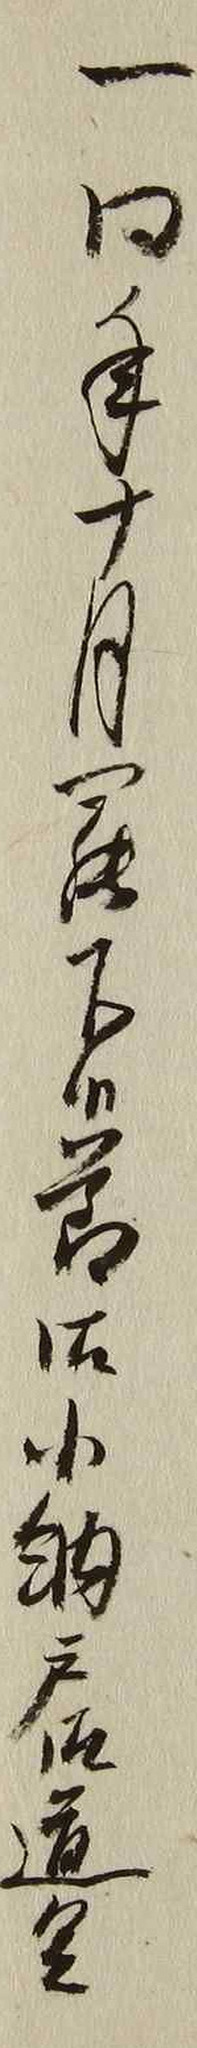一同年十月罷下候節御小納戸御道具
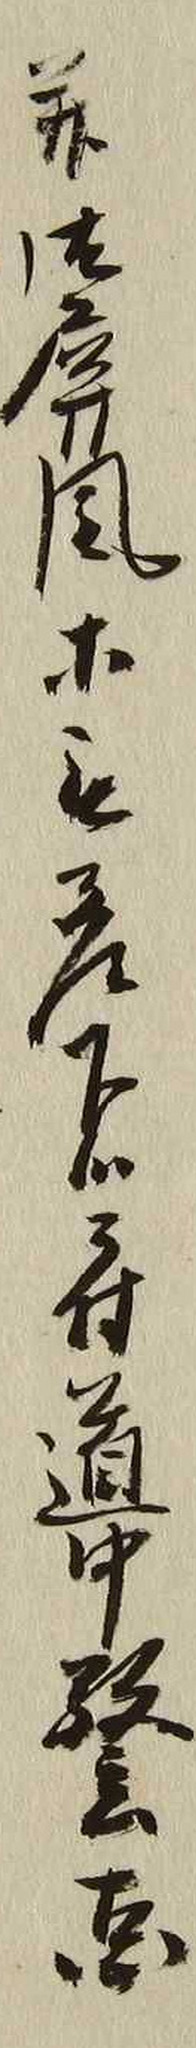并御屏風等被差下候ニ付道中警固
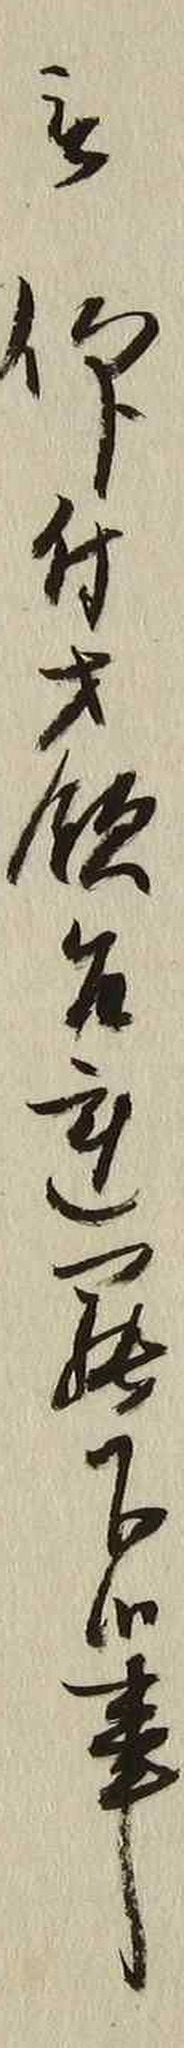被仰付才領召連罷下候事
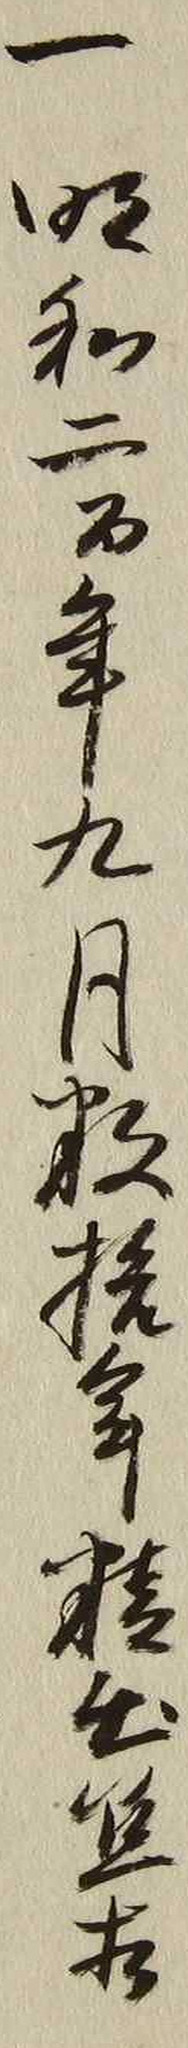一明和二酉年九月数拾年精出宜相
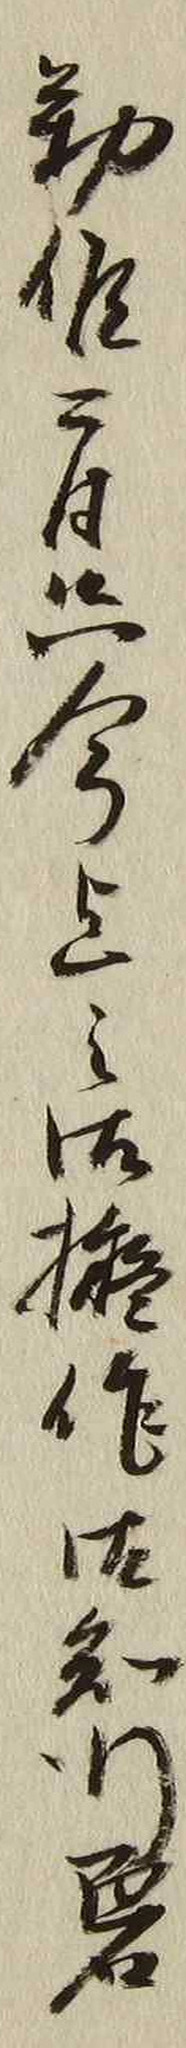勤候ニ付只今迄之御擬作御知行百石
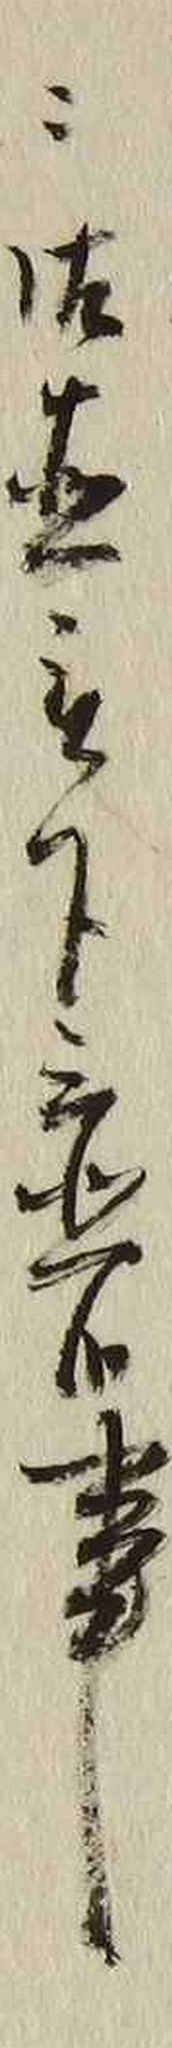ニ御直被下置候事
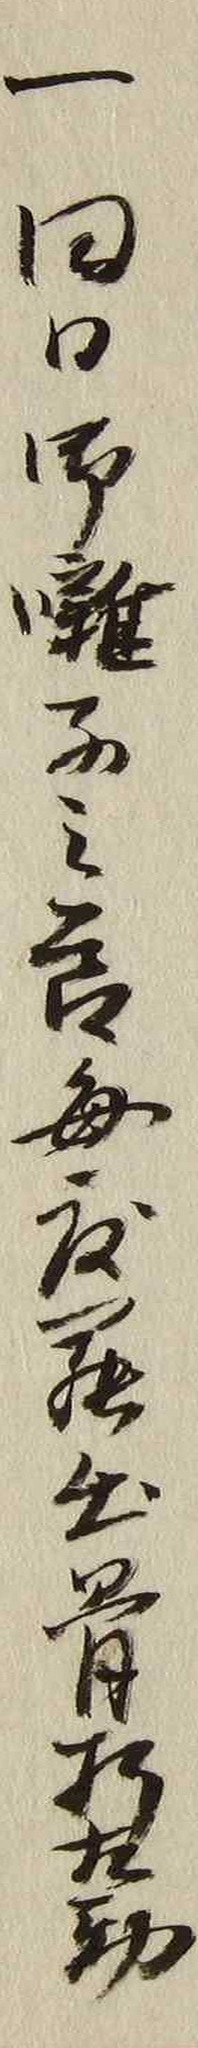一同日御囃子之節毎度罷出骨折相勤
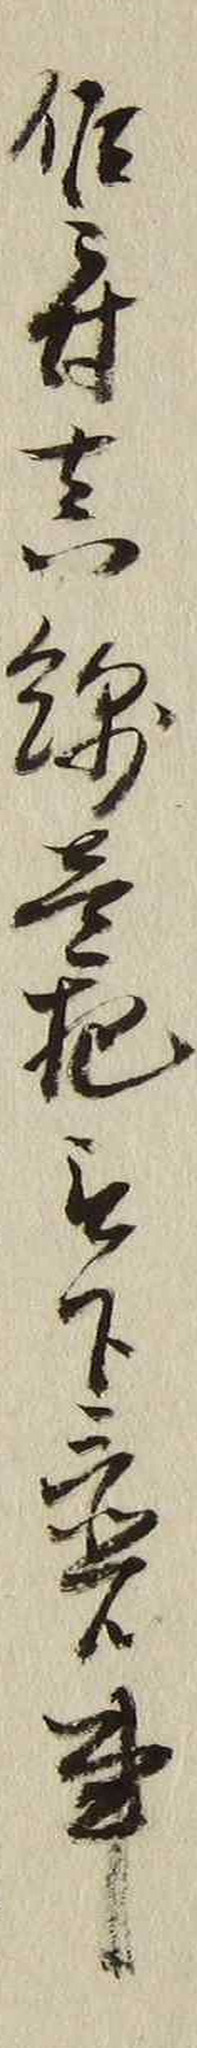候ニ付真綿壱把被下置候事
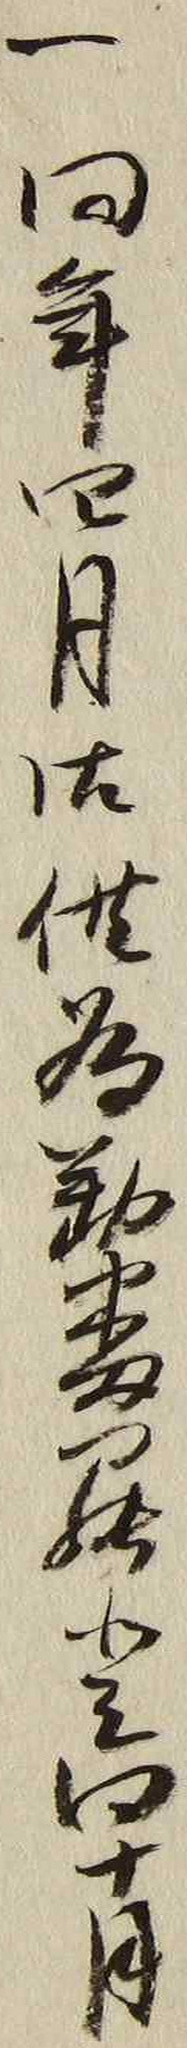一同年四月御供為勤番罷登同十月
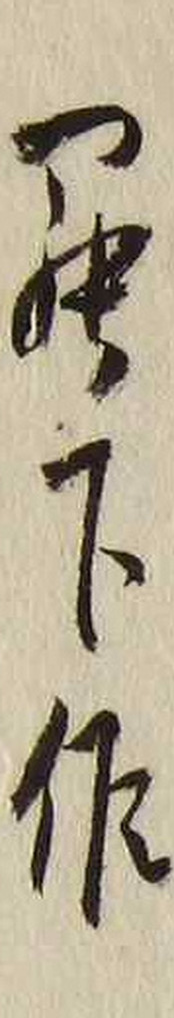罷下候
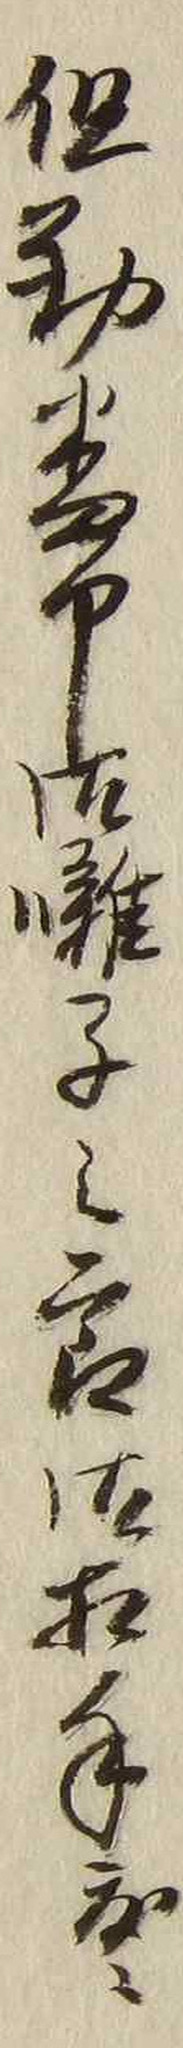但勤番中御囃子之節御相手度々

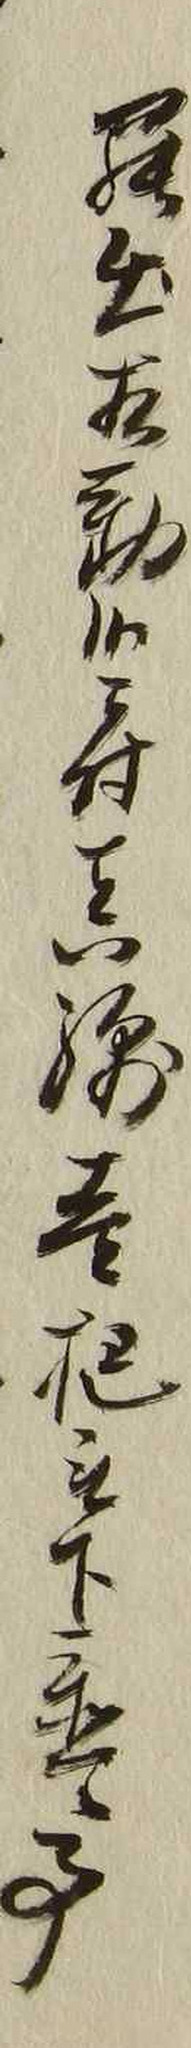罷出相勤候ニ付真綿壱把被下置候事
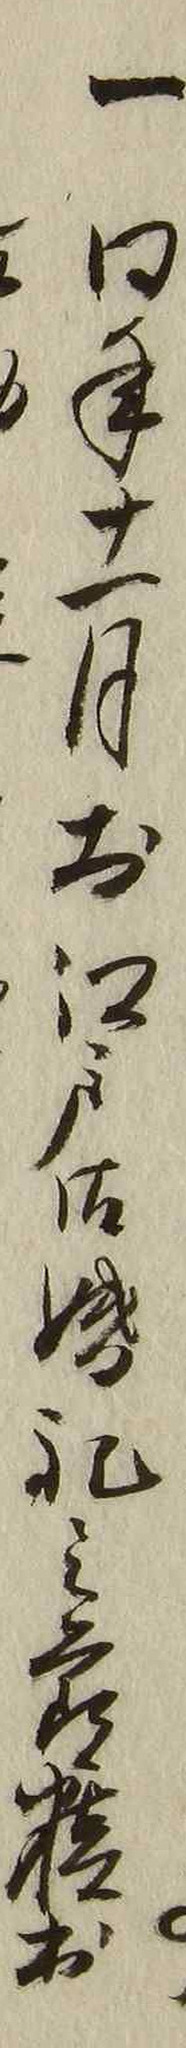一同年十一月於江戸御婚礼之節精出
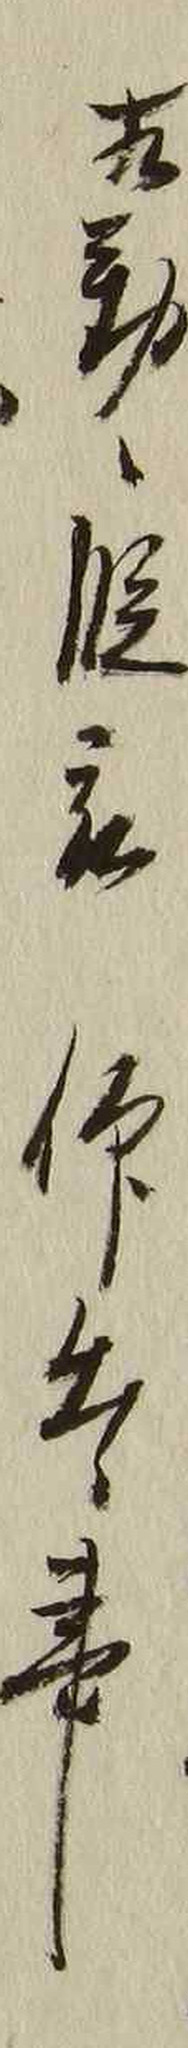相勤候段被仰出候事
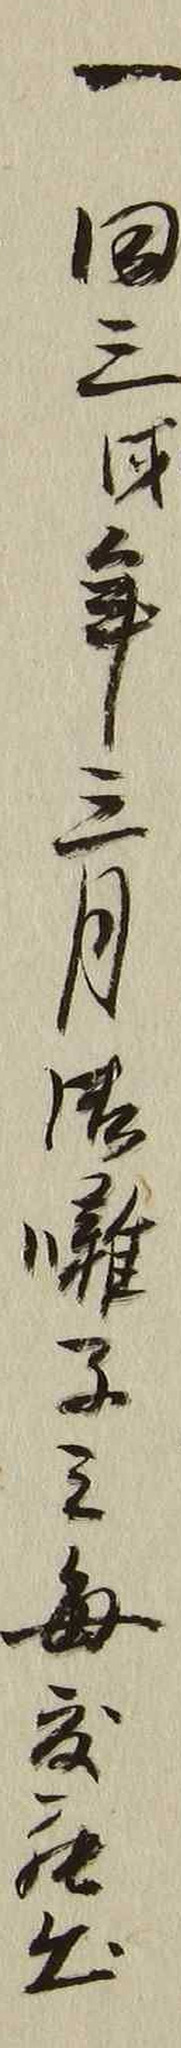一同三戌年三月御囃子之毎度罷出
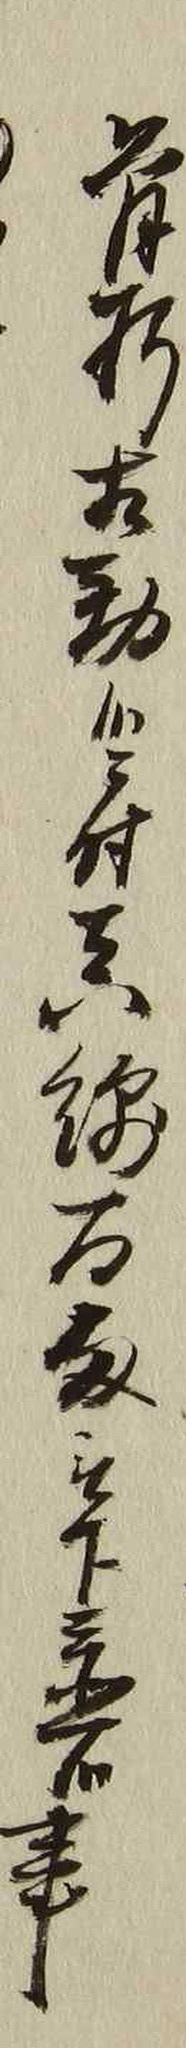骨折相勤候ニ付真綿百匁被下置候事
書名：諸士系譜　巻之349　も之部5
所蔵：会津若松市立会津図書館
